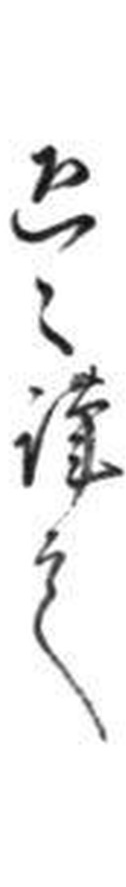恐々謹言
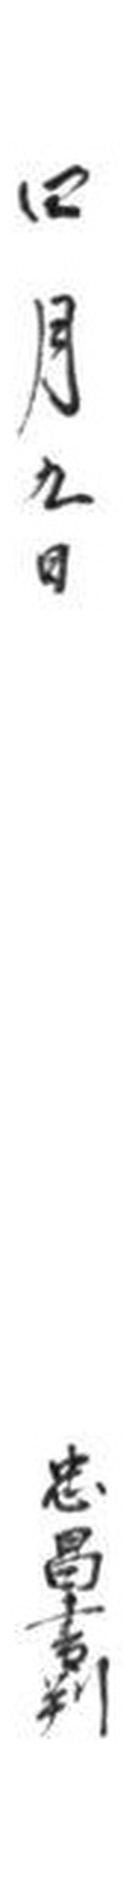四月十二日忠昌書判
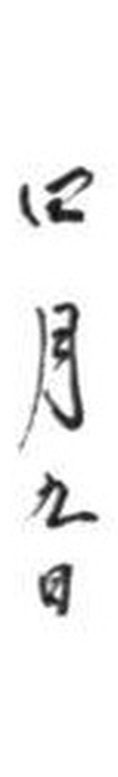四月九日
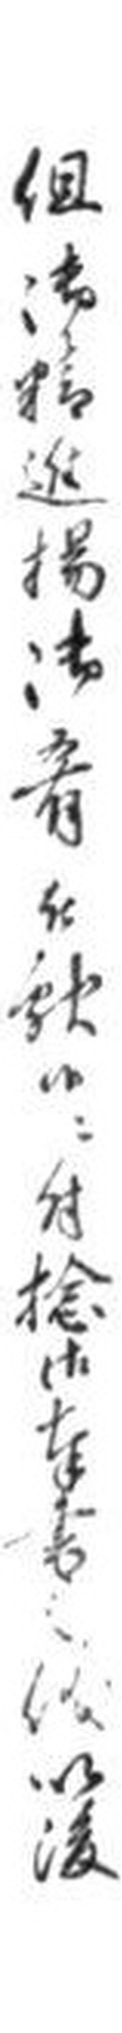但御精進揚御肴被献上候ニ付捻御奉書之儀以後
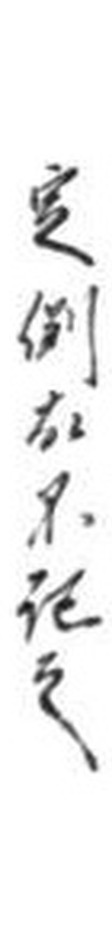定例故不記之
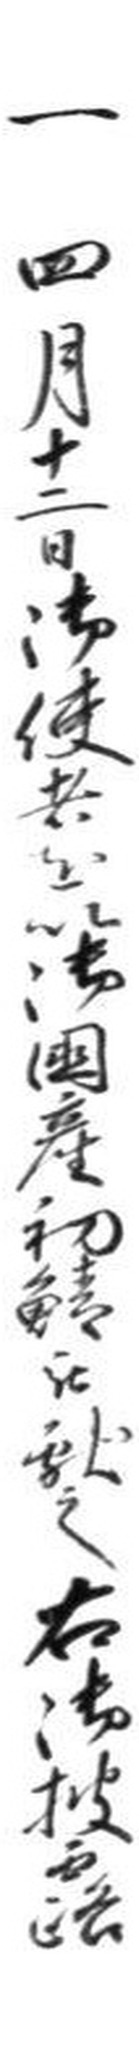一四月十二日御使者を以御国産初鯖被献之右御披露
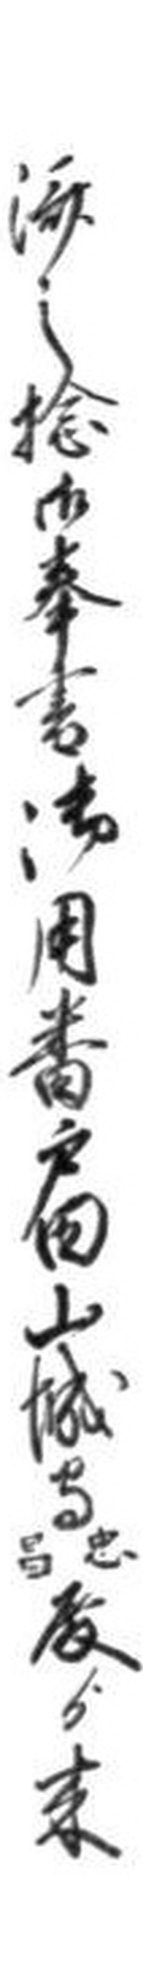済之捻御奉書御用番戸田山城守忠昌殿ゟ来
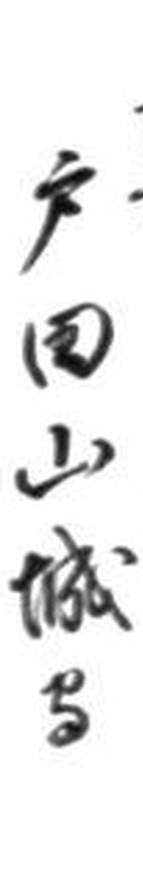戸田山城守
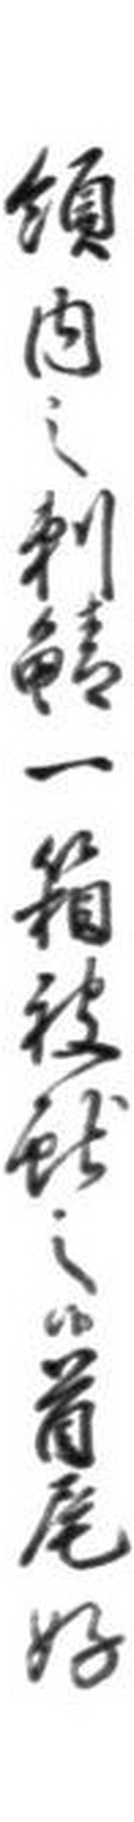領内之刺鯖一箱被献之候首尾好
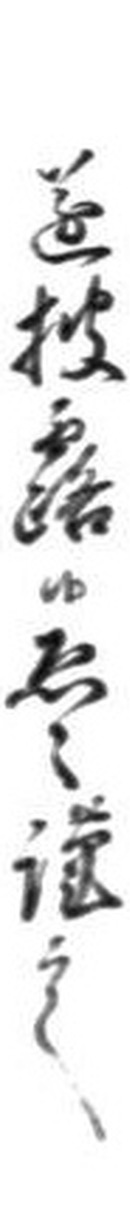遂被露候恐々謹言
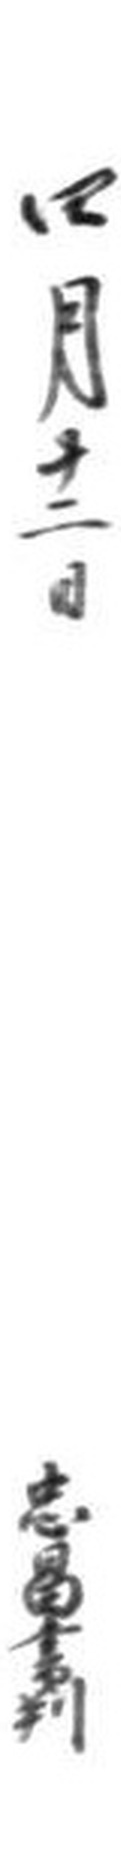四月十二日忠昌書判
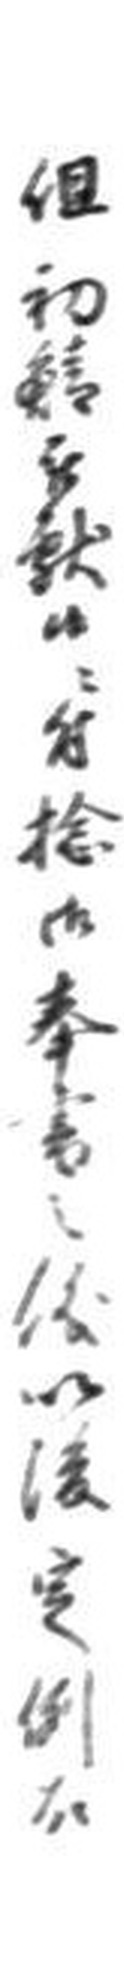但初鯖被献候ニ付捻御奉書之儀以後定例故
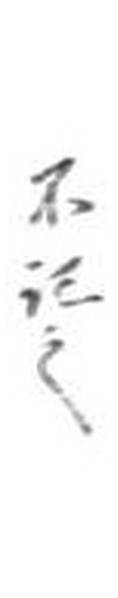不記之
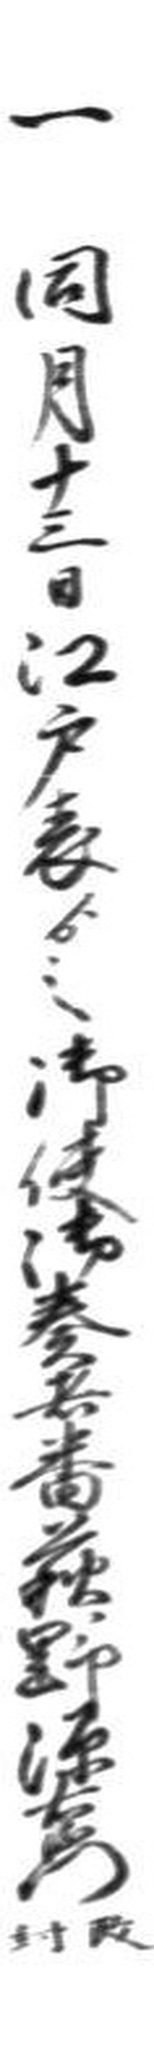一同月十三日江戸表ゟ御使御奏者番萩野源右衛門正封
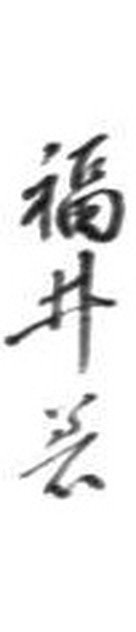福井着

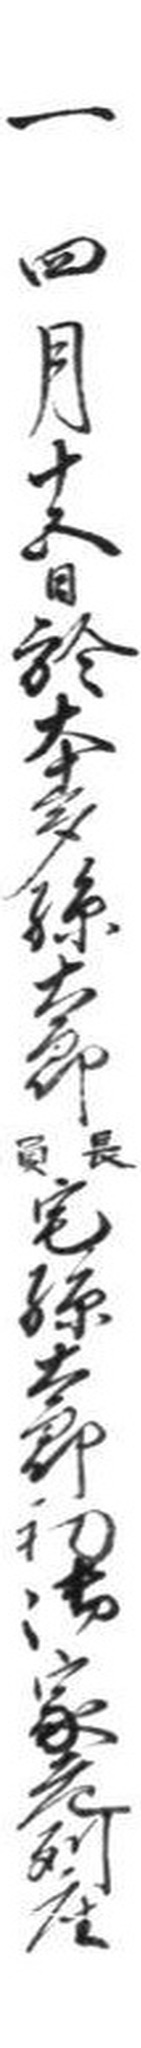一四月十五日於本多孫太郎長員宅孫太郎初御家老列座
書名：家譜 十六 吉品公 従貞享三年閏三月到同四年
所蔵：福井県文書館 Fukui Prefectural Archives
